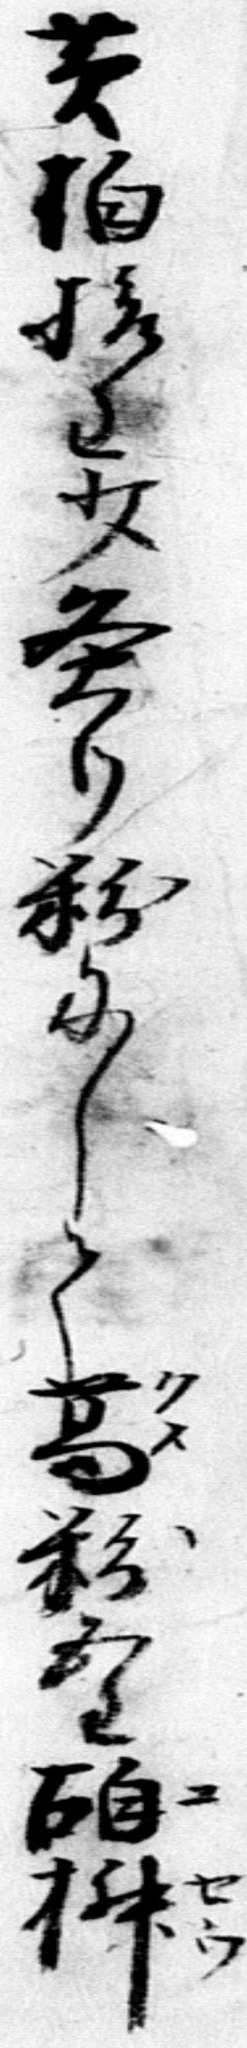黄柏拾匁少炙り粉にして葛粉五匁胡椒
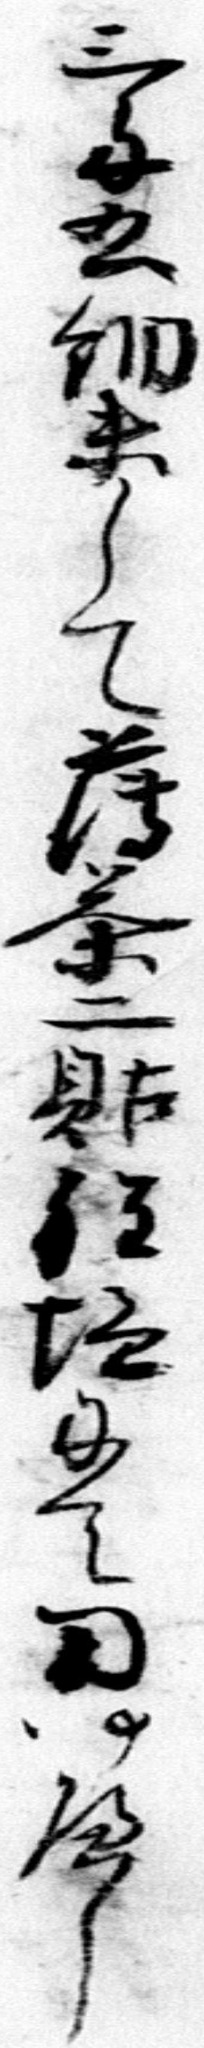三匁右細末して薄茶二貼程塩にて用ゆへし
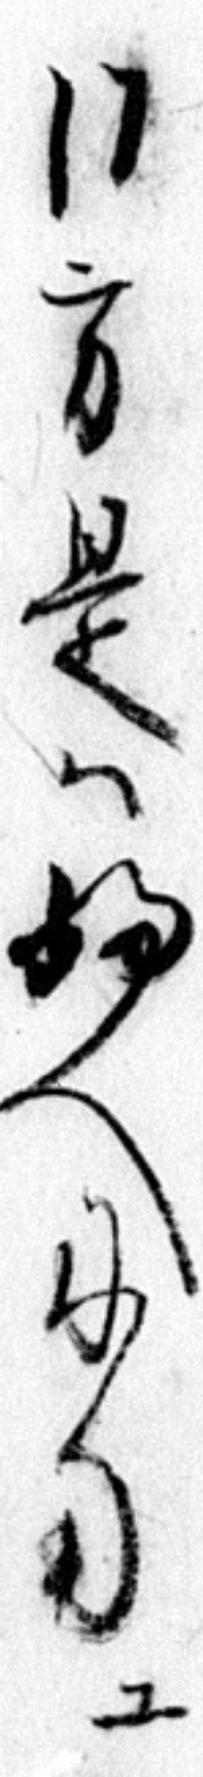同方是は婦人に用ゆ
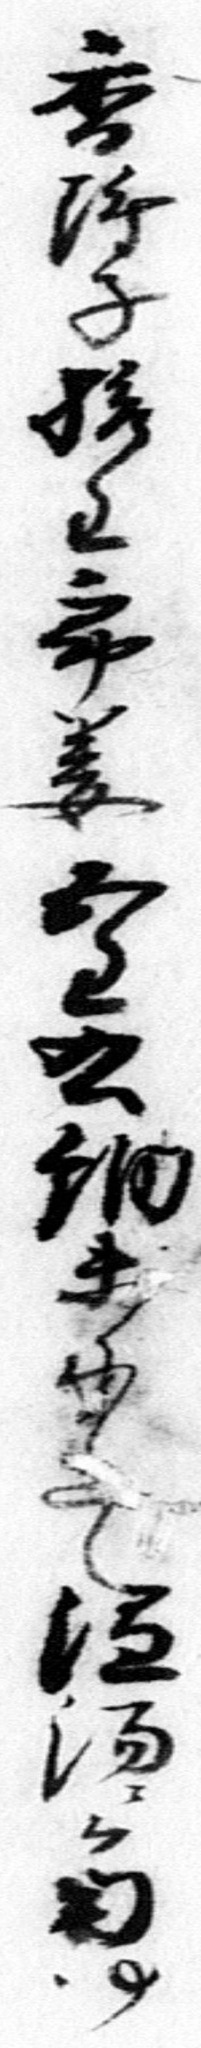香附子拾匁郎姜五匁右細末にして温湯にて用ゆ
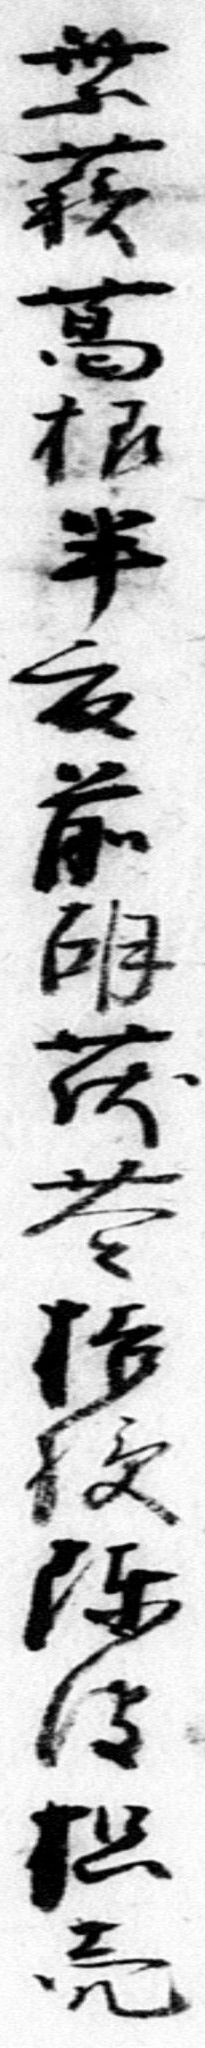葉蘇葛根半夏前胡茯苓桔梗陳皮枳売
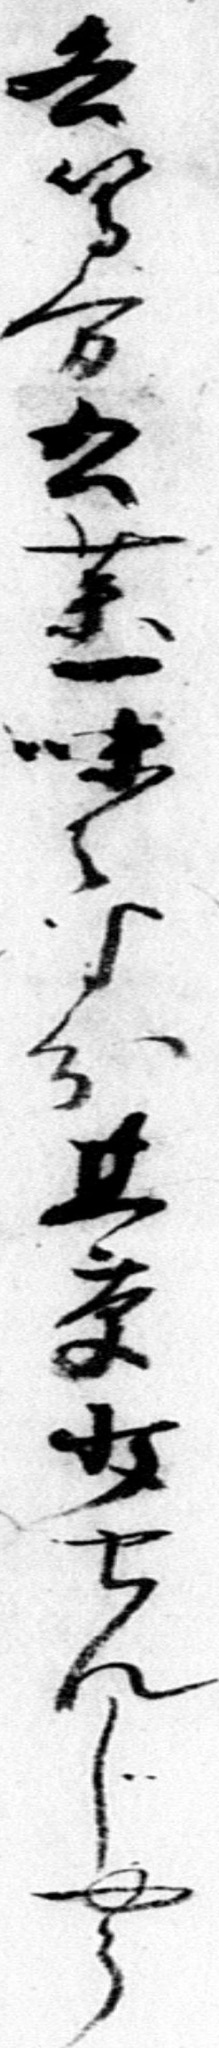各等分右薬一味之半分甘草少せんじやう
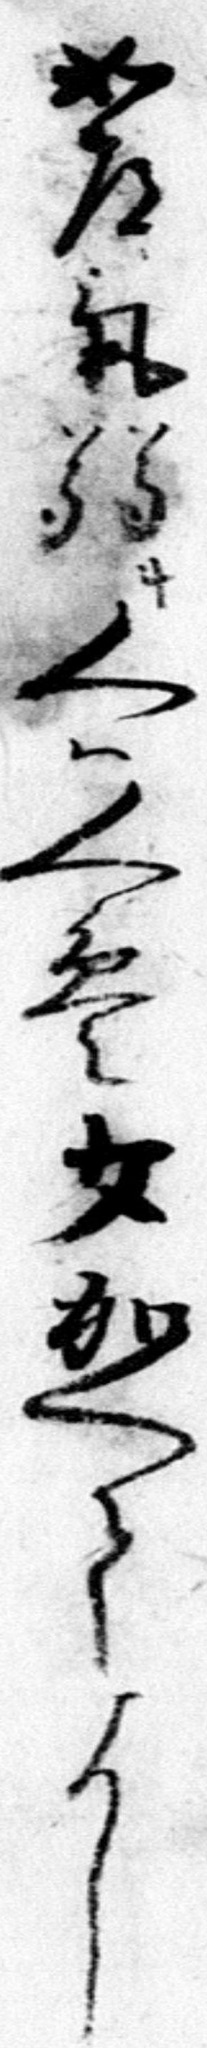如常気弱き人は人参少加へてよし
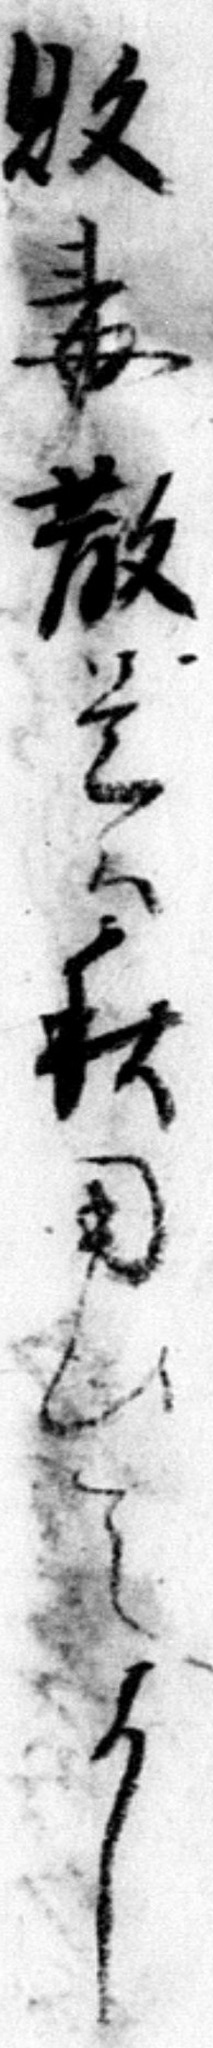敗毒散是は秋用ひてよし
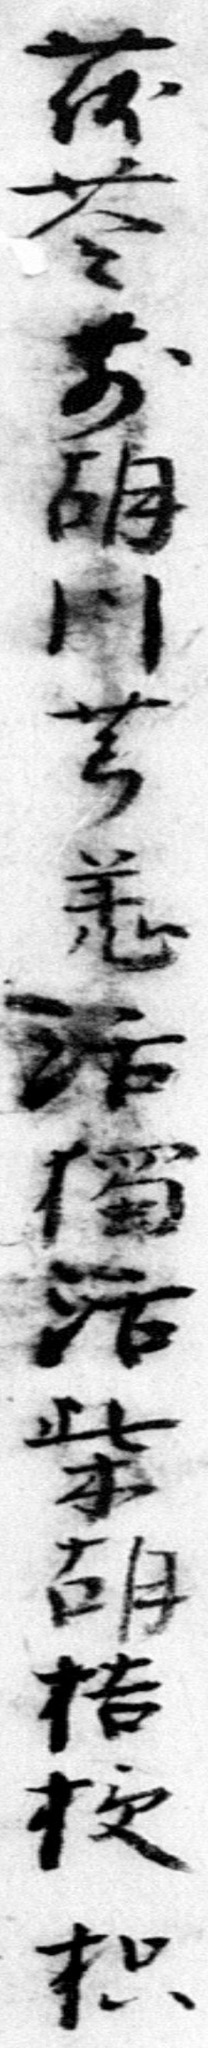茯苓前胡川芎羗活独活柴胡桔梗枳

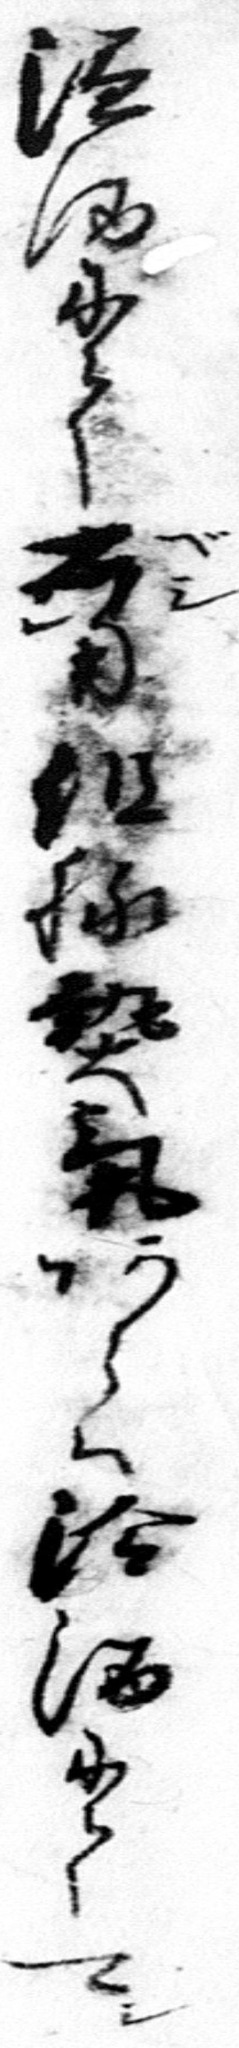温酒にて可用但脈熱気あらは冷酒にて可し
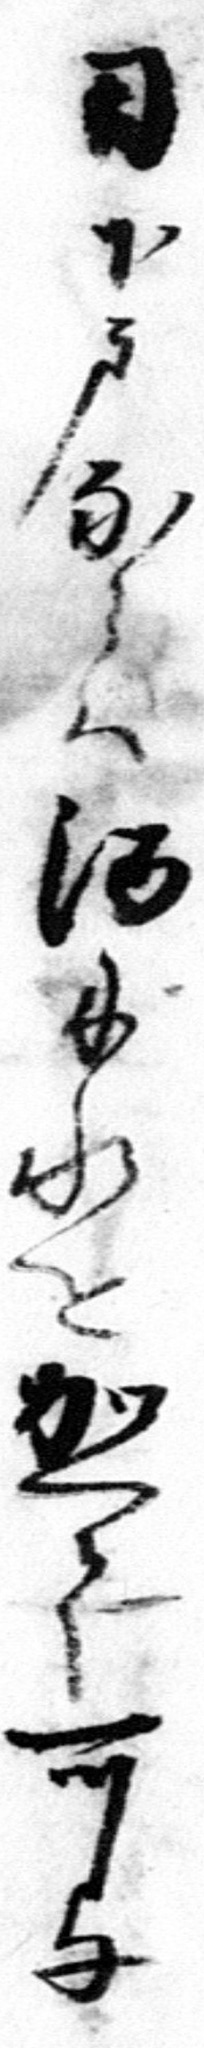用下戸ならは酒に水を加へて可与
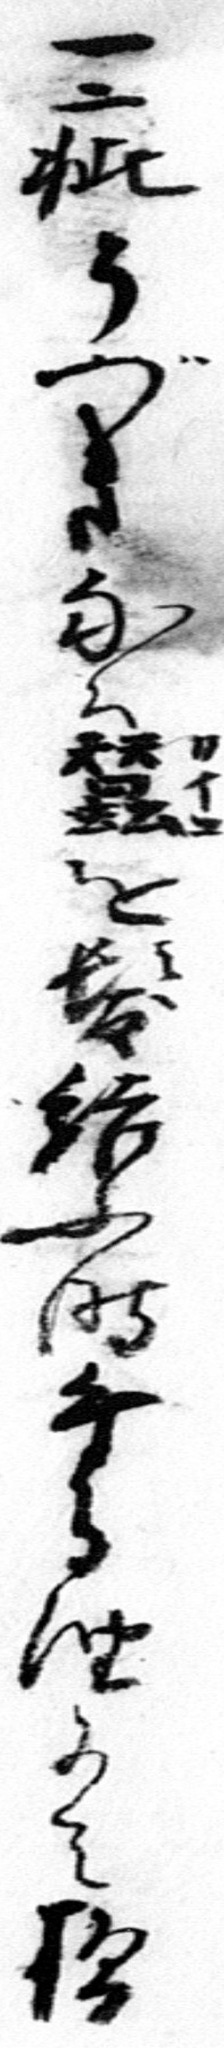一疵うづきなは蚕を髪結ふ時付る油にて摺
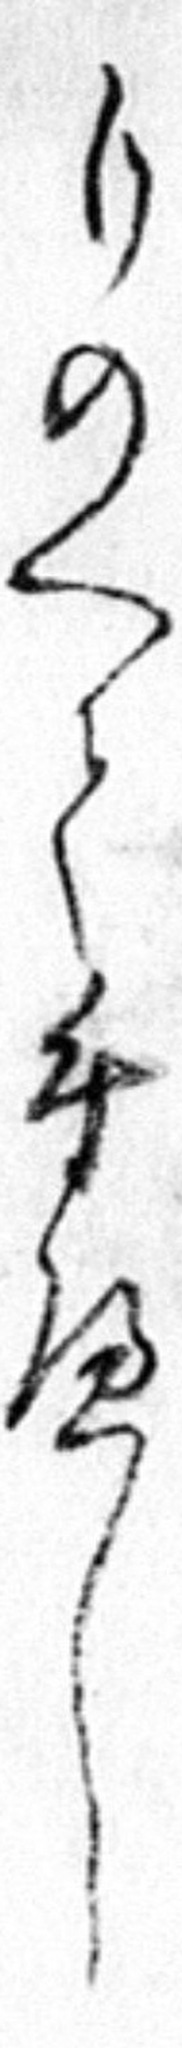りのへて付へし
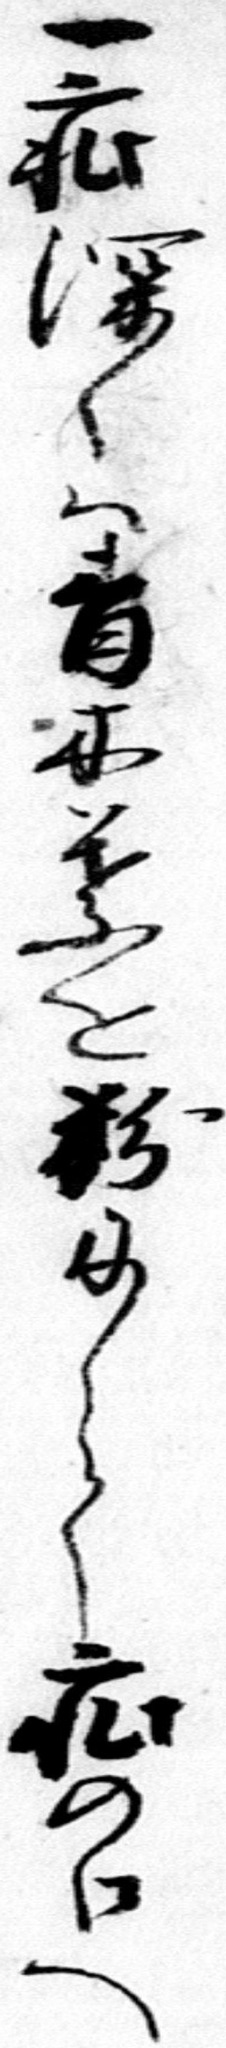一疵深くは青木葉を粉にて疵の口へ
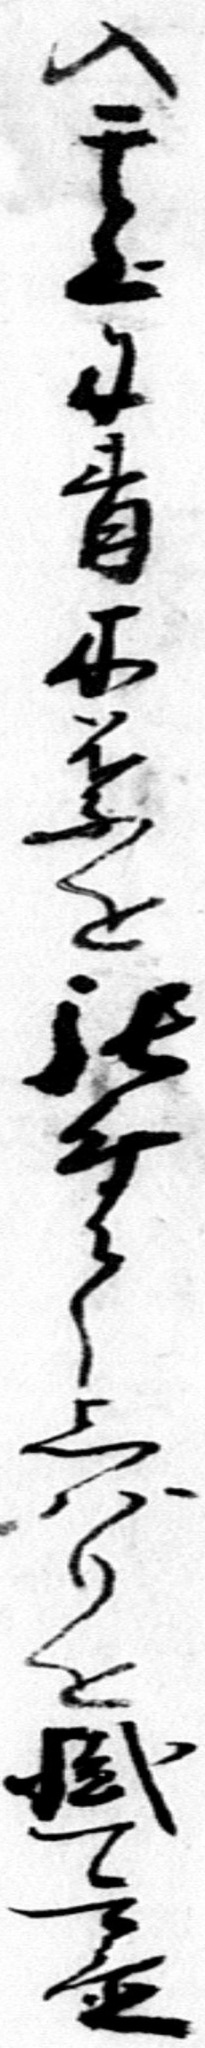入其上に青木葉を張付てしばりを掛て可置
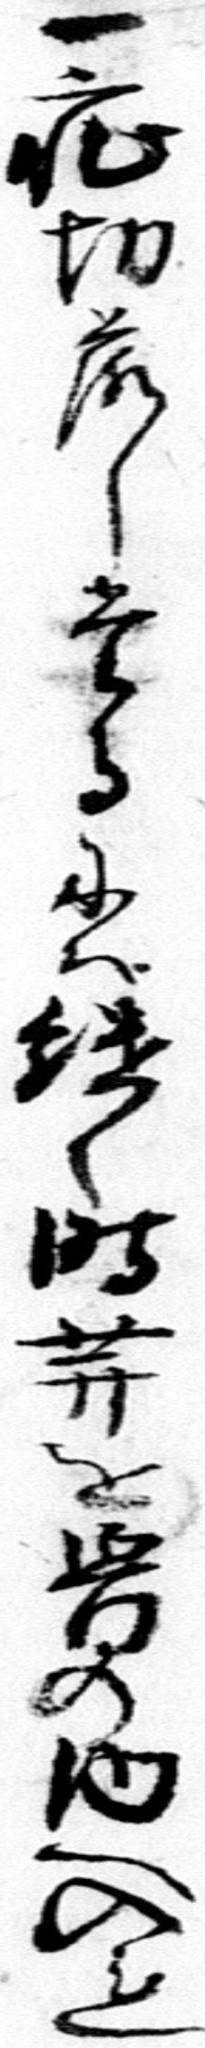一疵切落したるには継く時笄を骨の内へ入れ
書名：名薬秘伝之書
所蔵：徳島県立図書館
